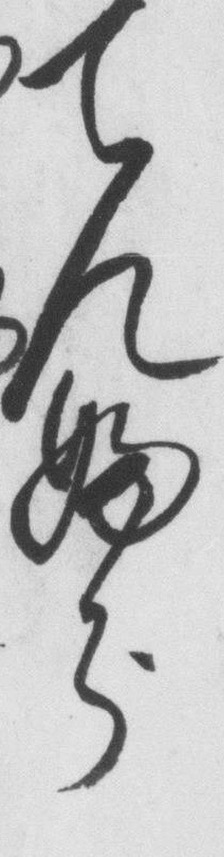てんふら
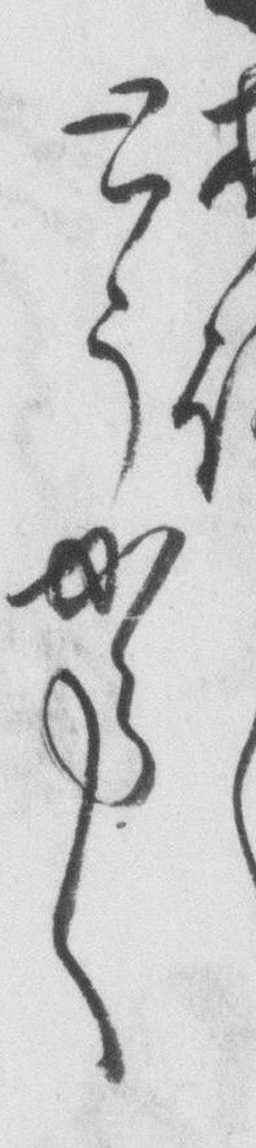とうからし
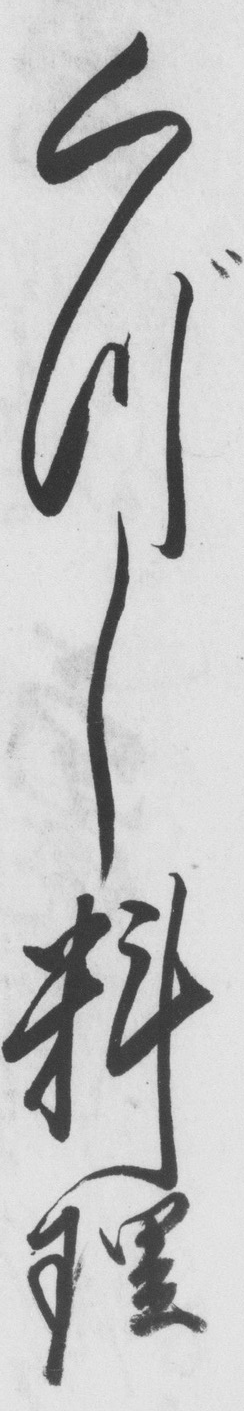くづし料理
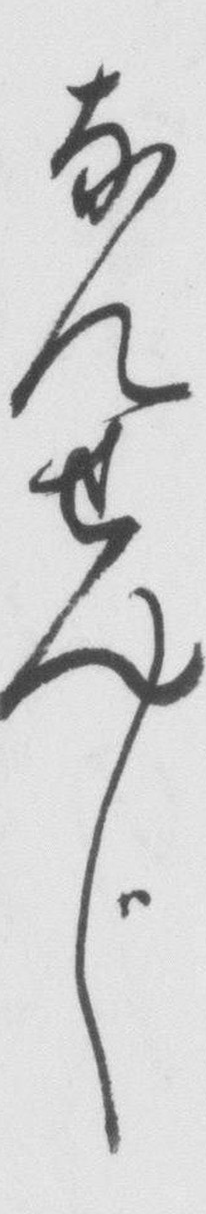なんせんじ
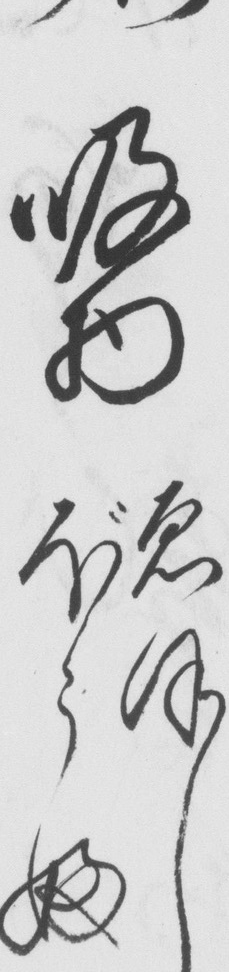のりぼうふ

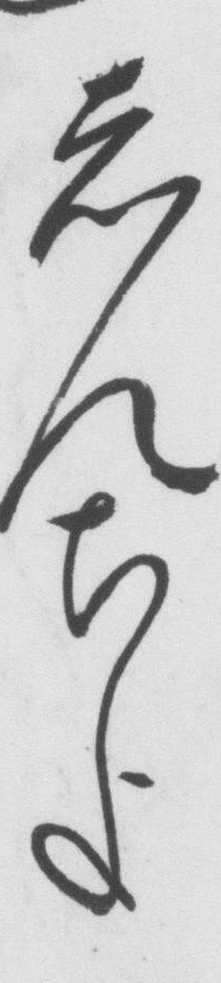ゑんちよ
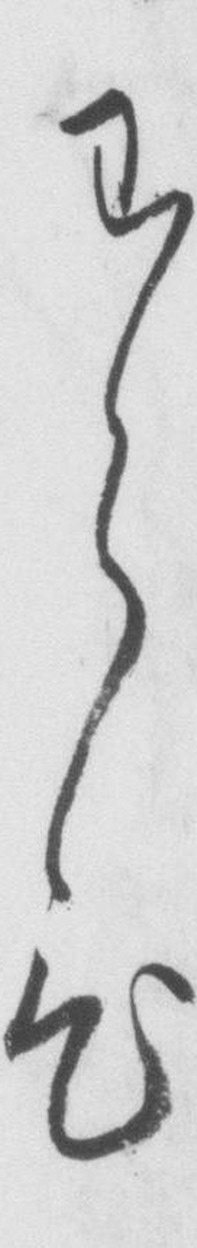わらひ
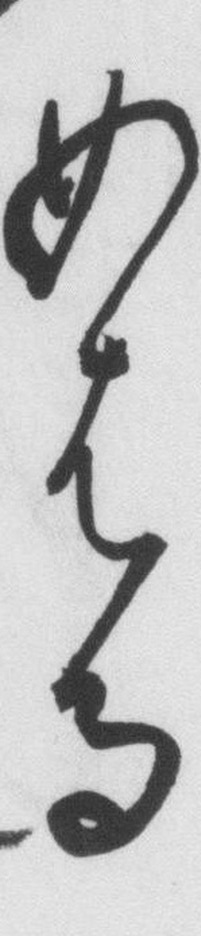めはる
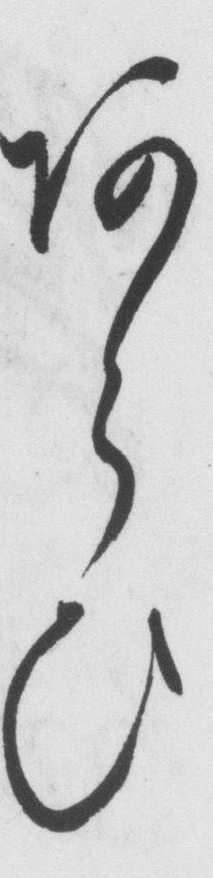わらひ
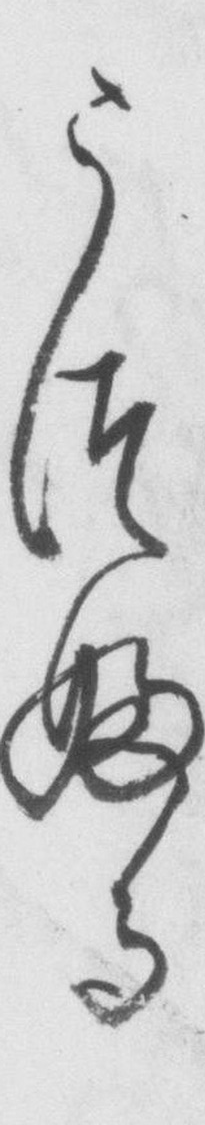うつふる
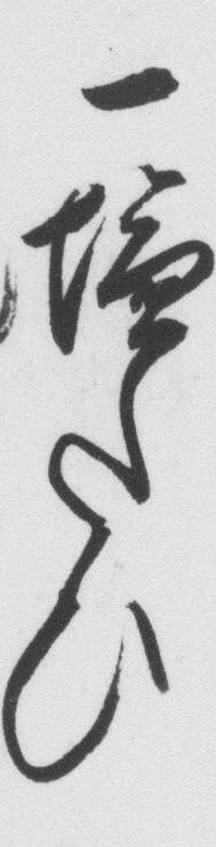一塩たひ
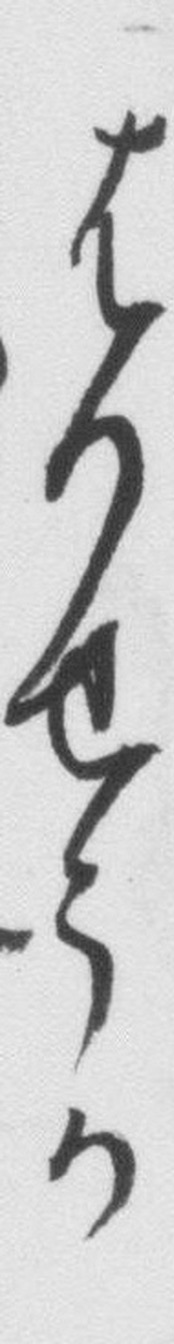はりせうか
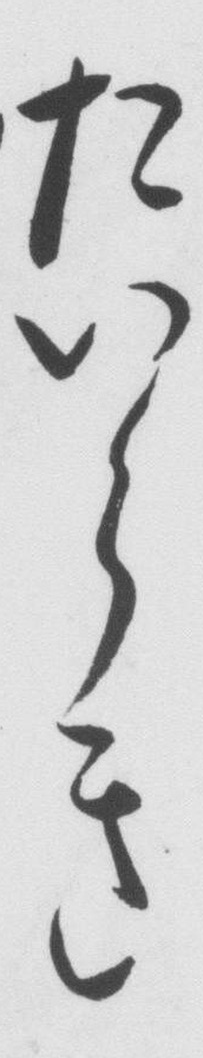たいらき
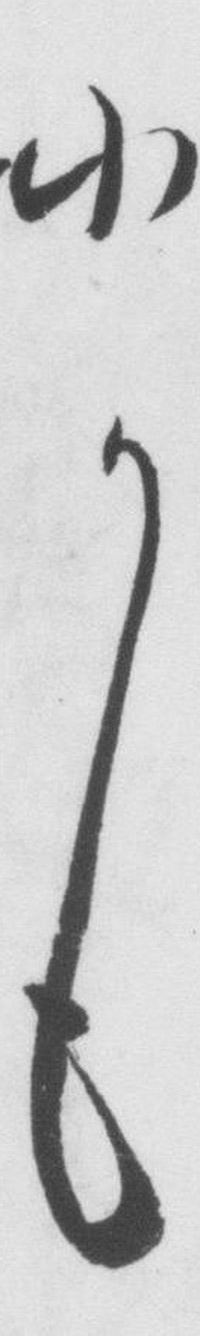小かも
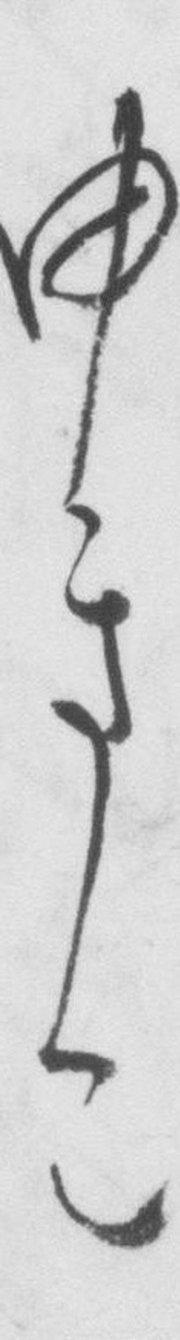ゆきこ
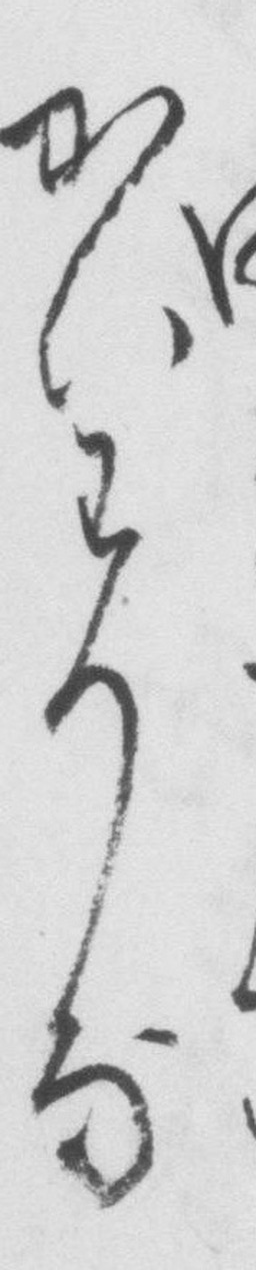かいわりな
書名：料理筌
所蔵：大阪府立大学学術情報センター 国文学研究資料館
